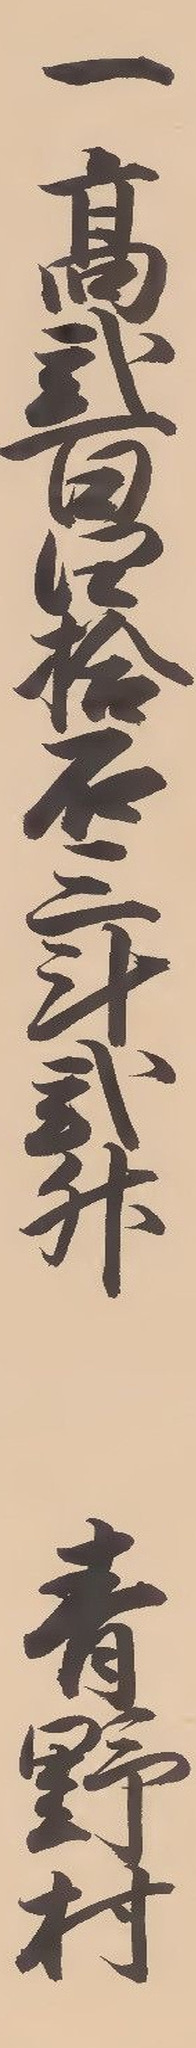一高弐百四拾石三斗弐升青野村
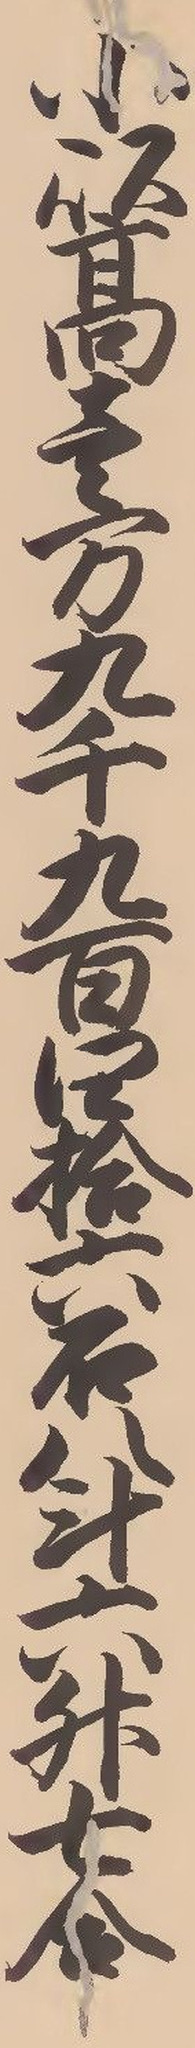小以高壱万九千九百四拾六石八斗六升七合
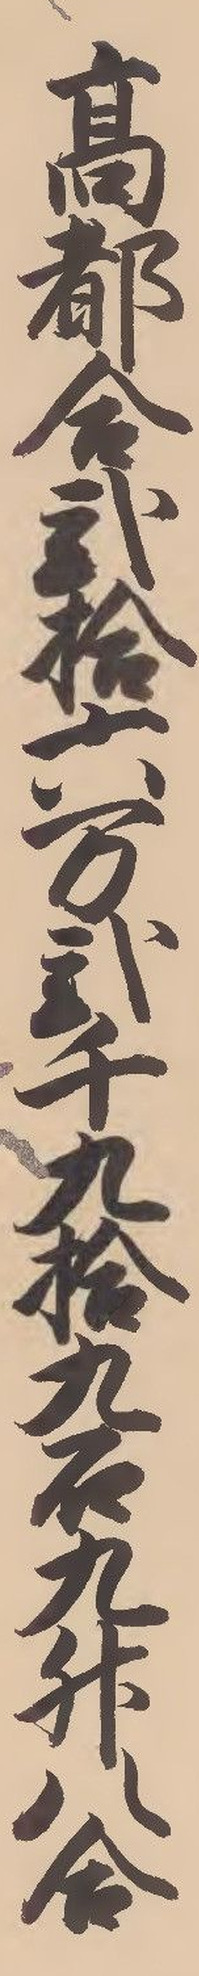高都合弐拾六万弐千九拾九石九升八合

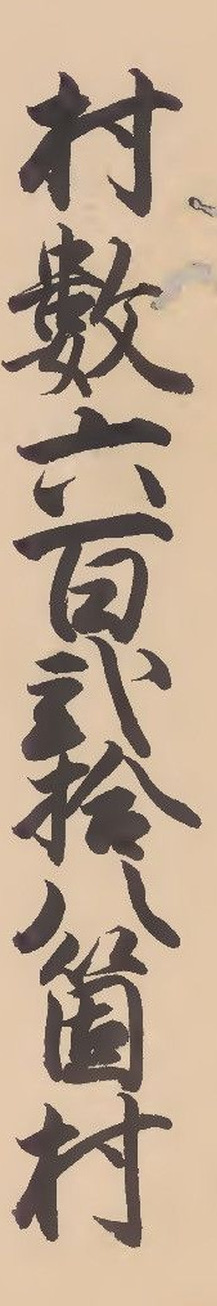村数六百弐拾八箇村
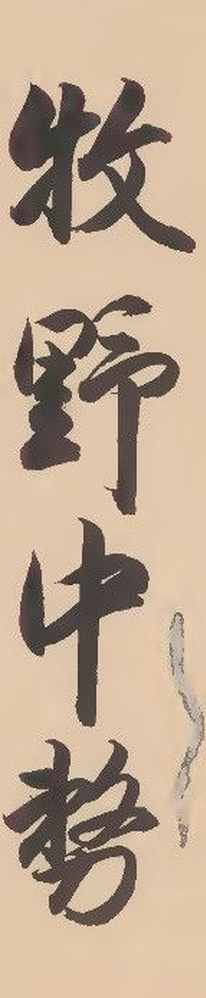牧野中務
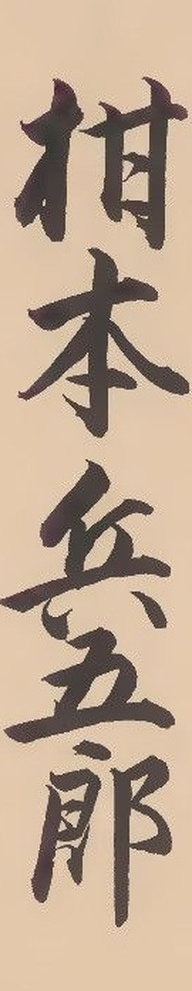柑本兵五郎
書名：美作国郷帳
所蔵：国立公文書館 National Archives of Japan
